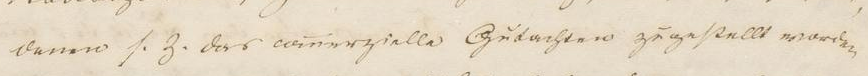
denen s. Z. das commerzielle Gutachten zugestellt worden
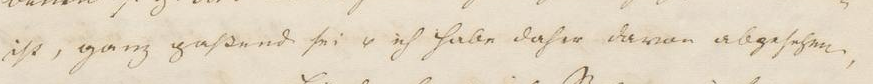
ist, ganz paßend sei & ich habe daher davon abgesehen,
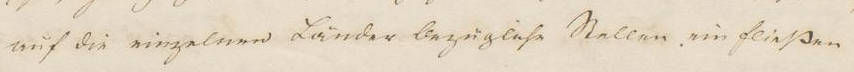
auf die einzelnen Länder bezügliche Stellen einfließen
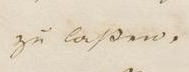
zu laßen.
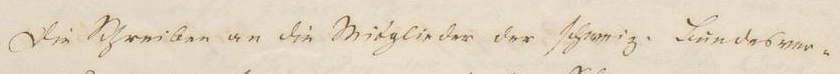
Die Schreiben an die Mitglieder der schweiz. Bundesver-
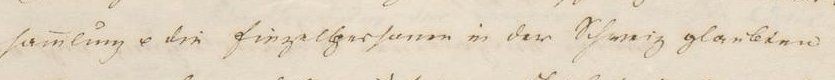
sammlung & die Einzelpersonen in der Schweiz glaubten
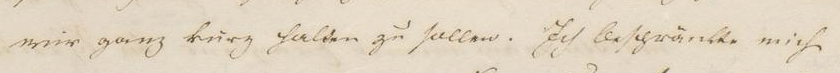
wir ganz kurz halten zu sollen. Ich beschränkte mich
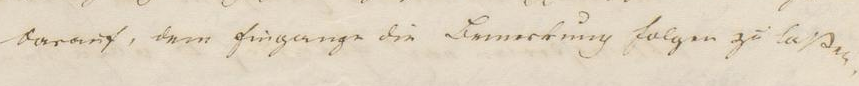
darauf, dem Eingange die Bemerkung folgen zu laßen,
